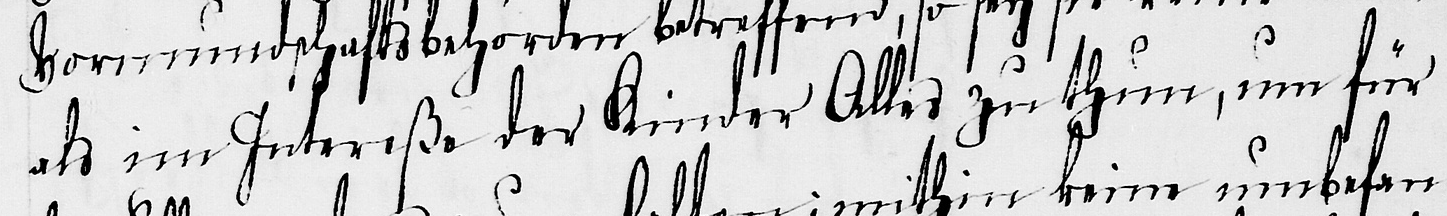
als im Intereße der Kinder Alles zu thun, um für
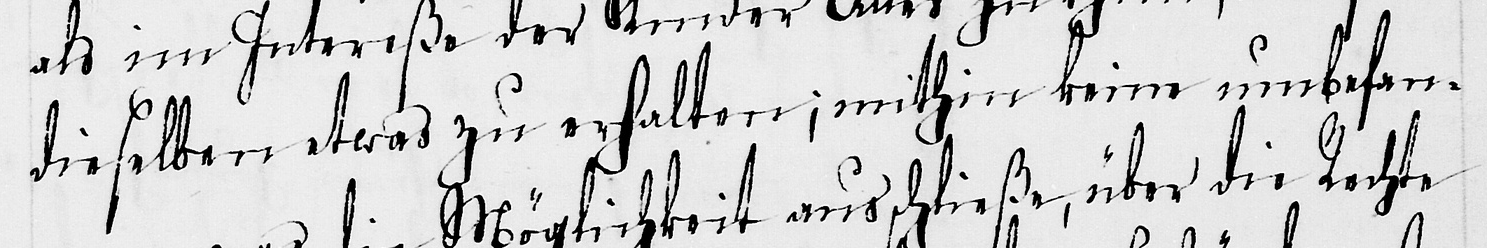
dieselben etwas zu erhalten; mithin keine unbefan¬
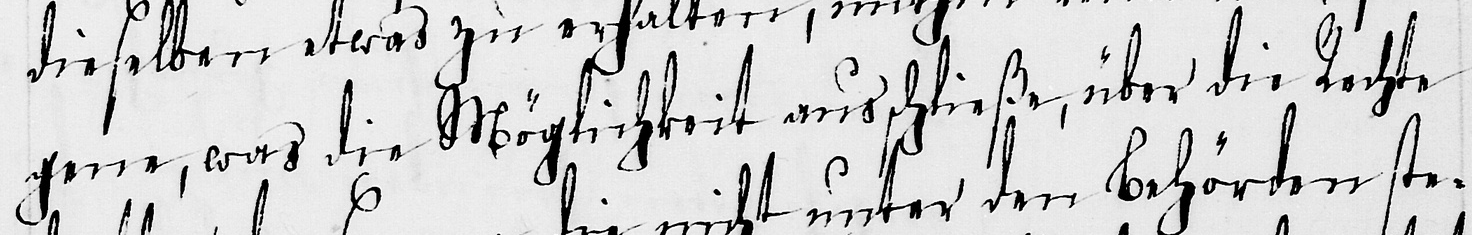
gene, was die Möglichkeit ausschließe, über die Rechte
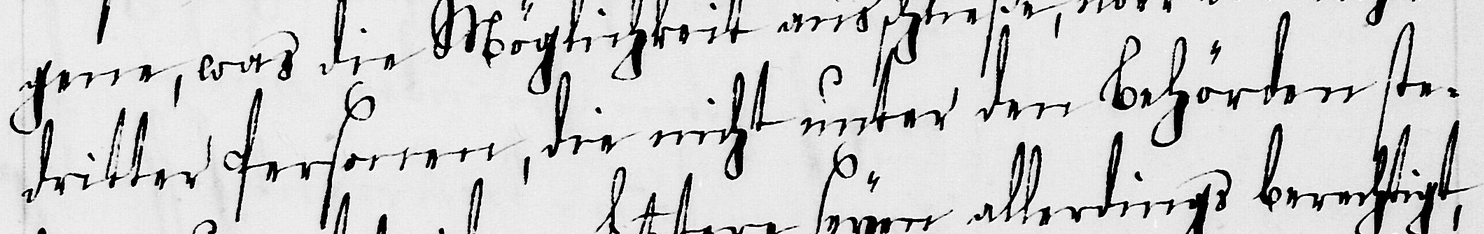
dritter Personen, die nicht unter den Behörden ste¬
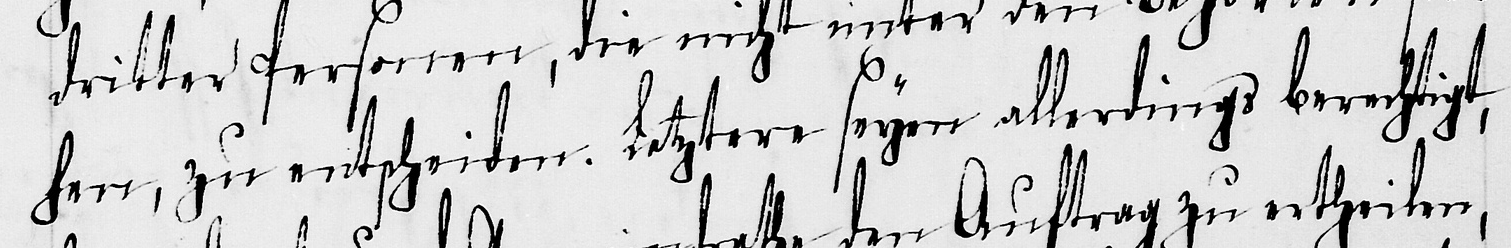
hen, zu entscheiden. Letztere seyen allerdings berechtig¬
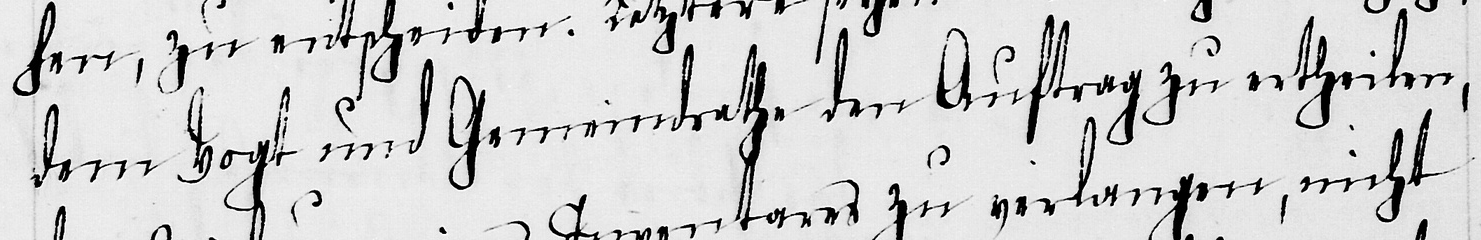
dem Vogt und Gemeindrathe den Auftrag zu ertheilen,
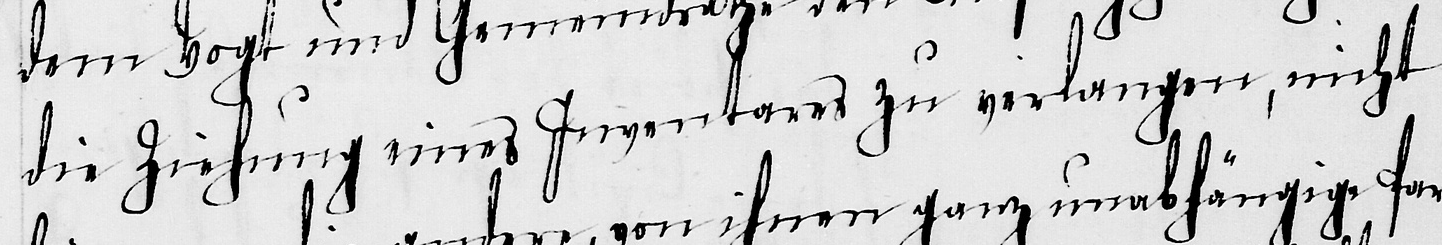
die Ziehung eines Inventares zu verlangen, nicht
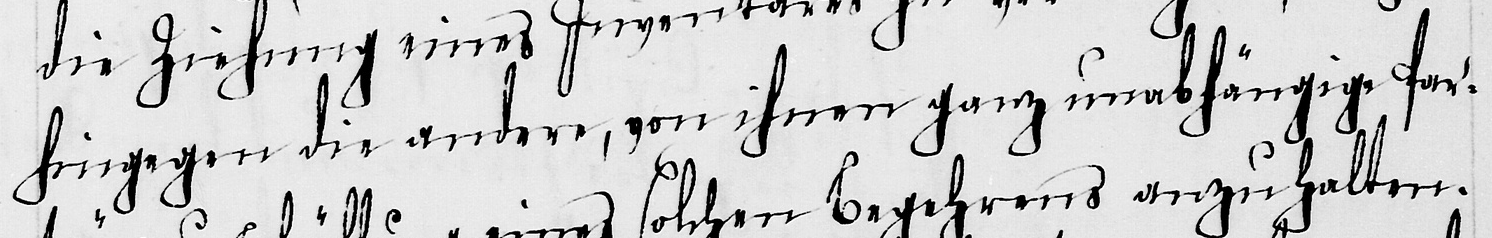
hingegen die andere, von ihnen ganz unabhängige Par¬
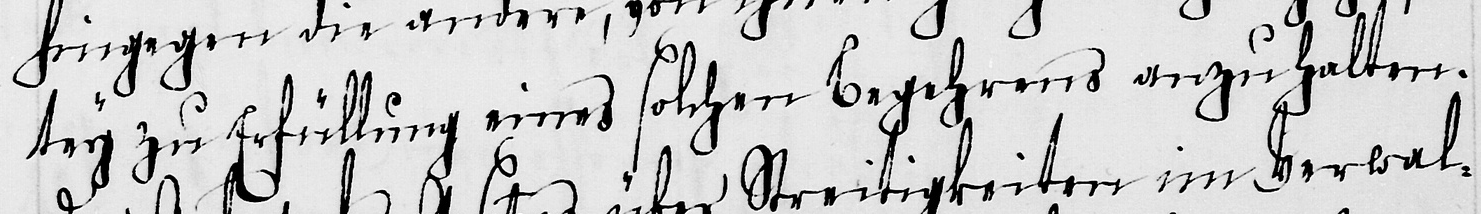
tey zu Erfüllung eines solchen Begehrens anzuhalten.
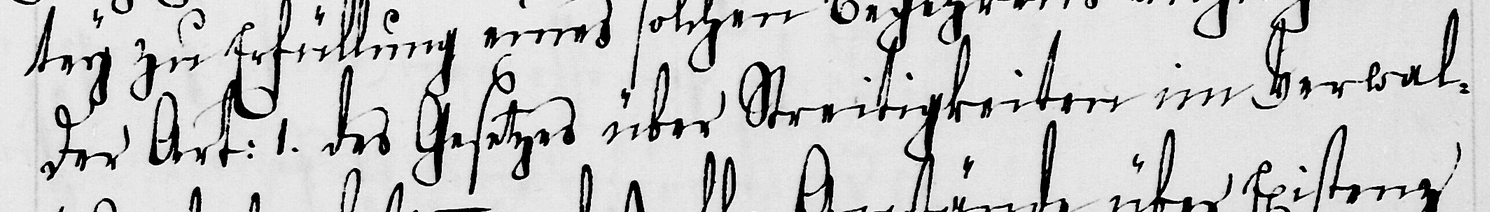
Der Art: 1. des Gesetzes über Streitigkeiten im Verwal¬
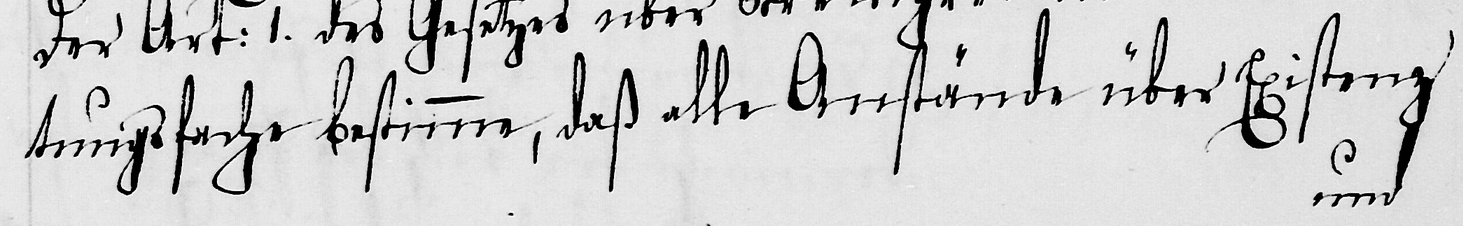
tungsfache bestimme, daß alle Anstände über Existenz
